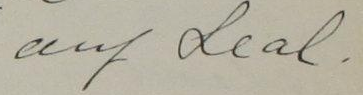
auf Leal
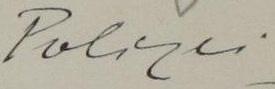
Polizei
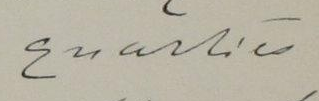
quartier
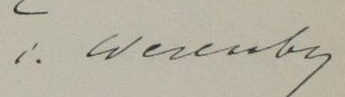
i. Wesenberg
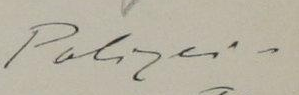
Polizei.
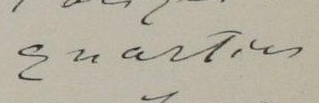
quartier
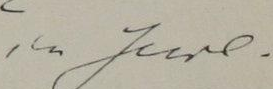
in Jewe
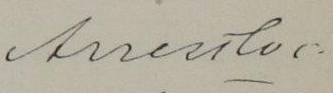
Arrestloc.
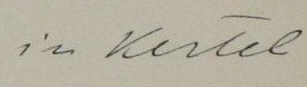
in Kertel
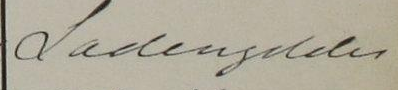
Ladengelder
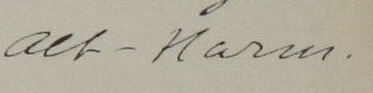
Alt-Harm.
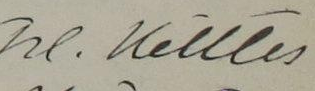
Frl. Kettler
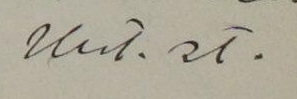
Unt.st.
